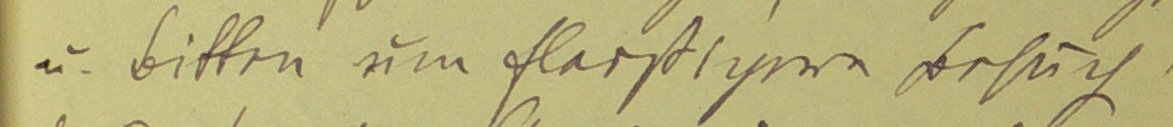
und Bitten um fleißigen Besuch
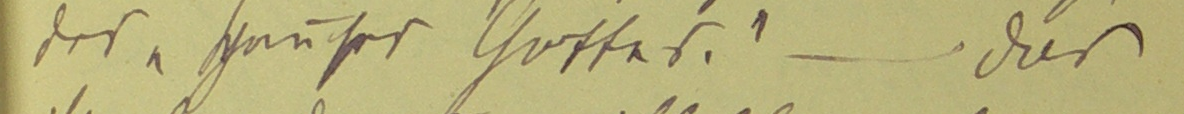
des !“ Hauses Gottes“.-Das
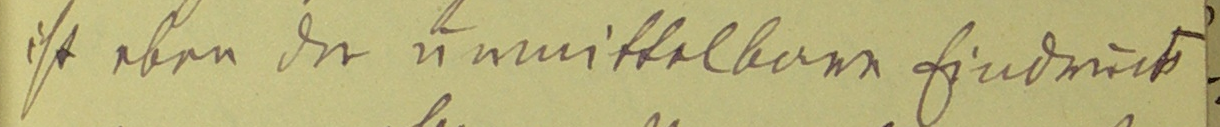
ist eben der unmittelbare Eindruck
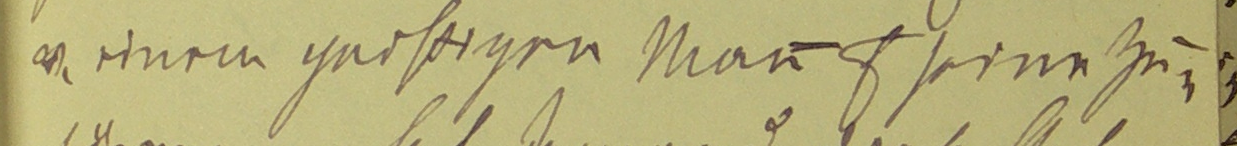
von einem garstigen Mann auf seine Zu¬
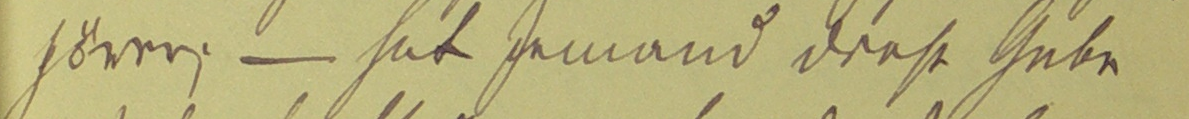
hörer.- Hat Jemand diese Gabe
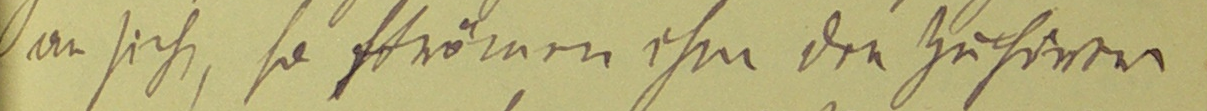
an sich, so strömen ihm die Zuhörer
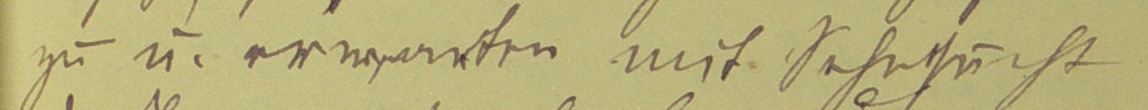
zu und erwarten mit Sehnsuch auf
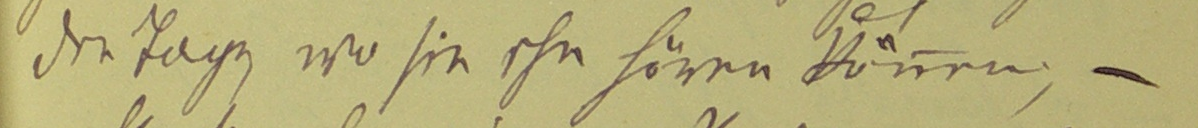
den Tag, wo sie ihn hören können.-
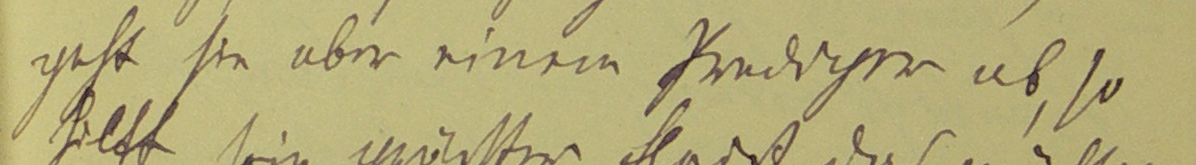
geht sie aber einen Prediger ab, so
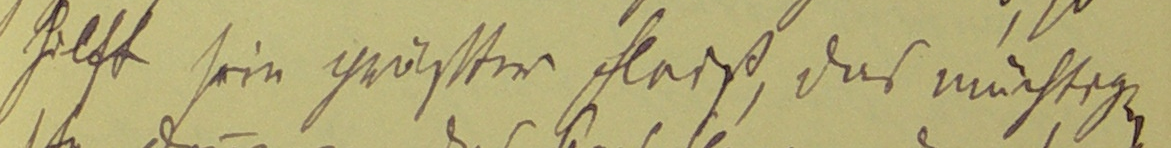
hilft sein größter Fleiß, das mächtig¬
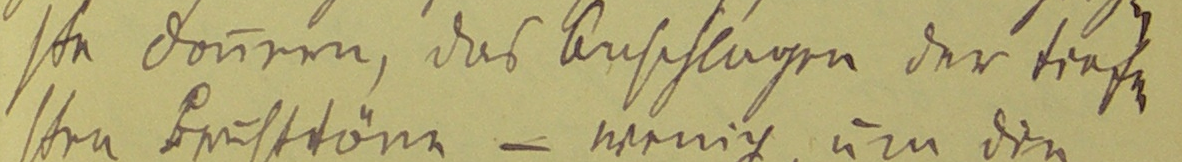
ste Donnern, das Anschlagen der tief¬
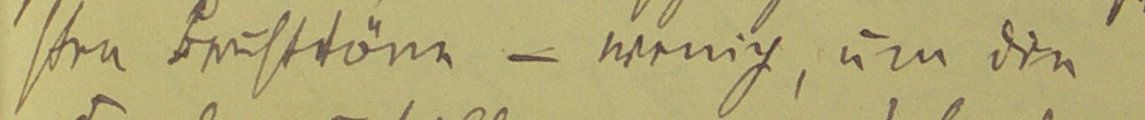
sten Brusttöne- wenig, um die
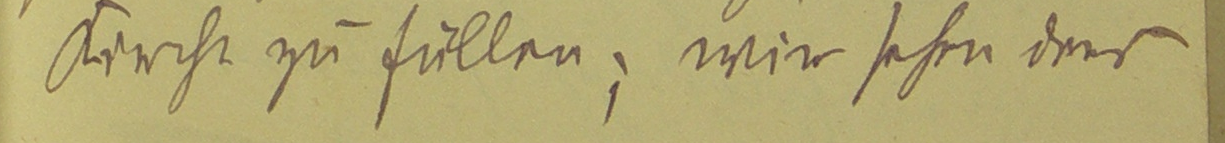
Kirche zu füllen; wir sehen dies---
